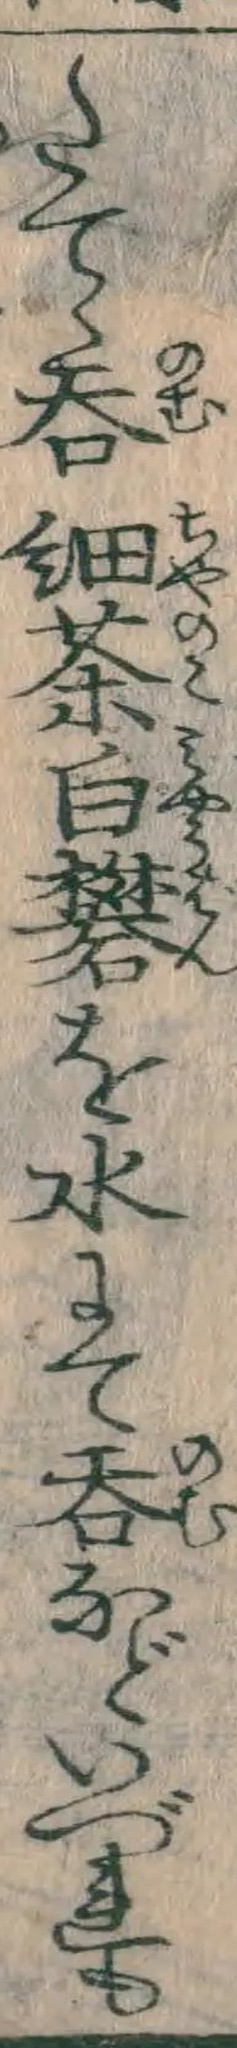たてゝ呑細茶白礬を水にて吞などいづれも
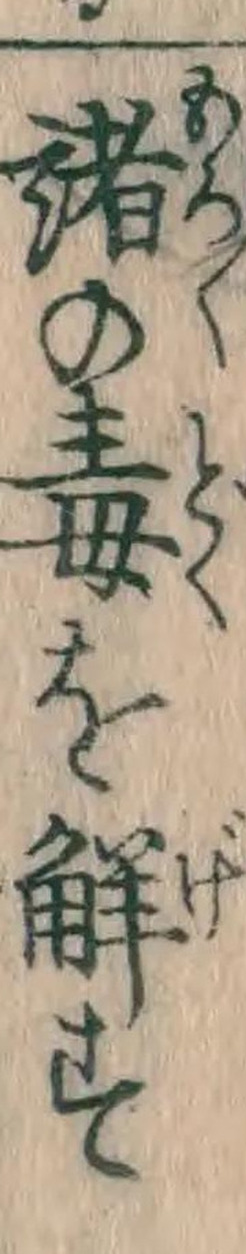諸の毒を解す
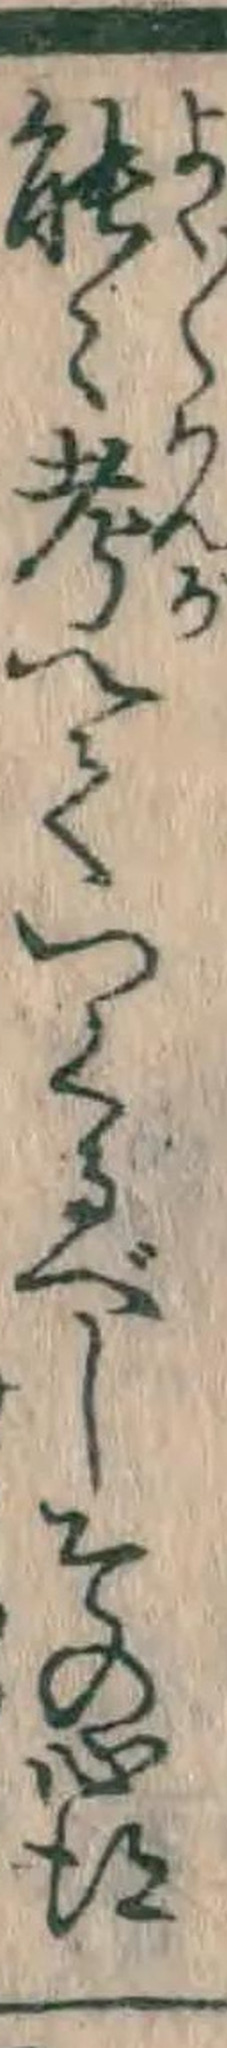能々考へてつくるべしその心得
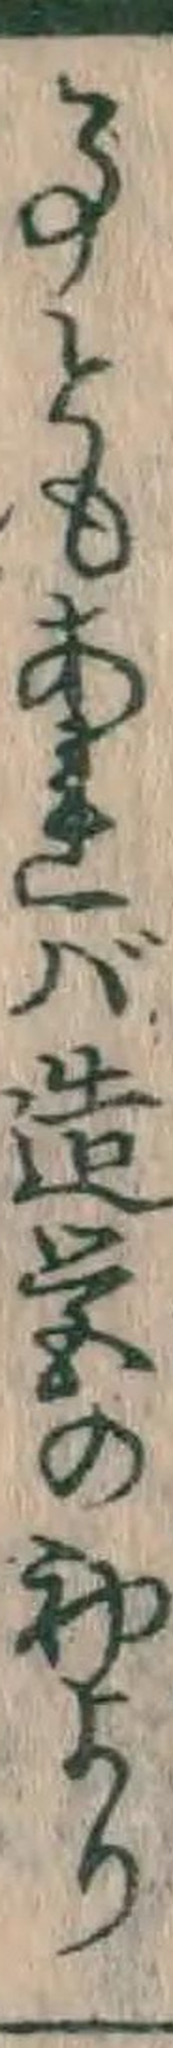事ともあれば造営の初より
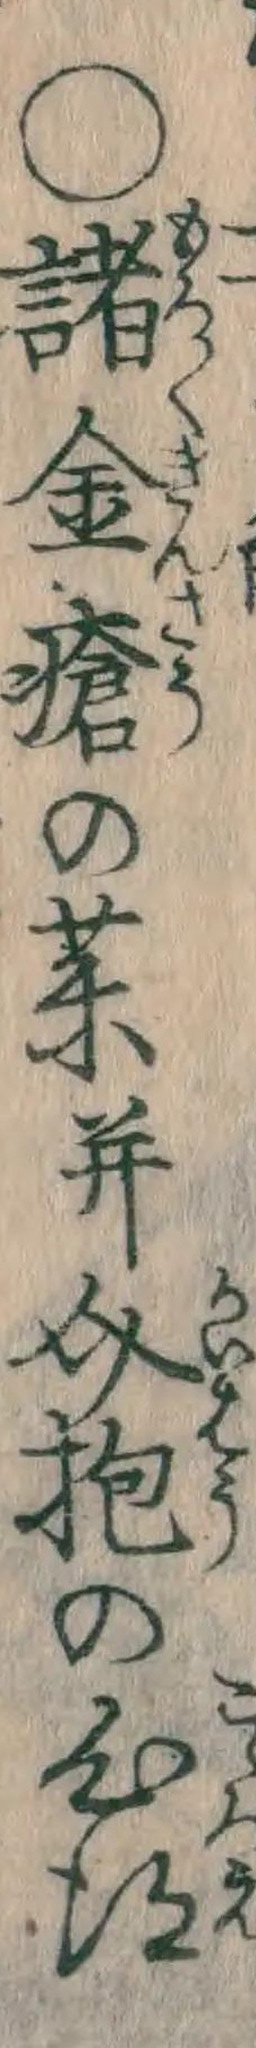○諸金瘡の薬并介抱の心得
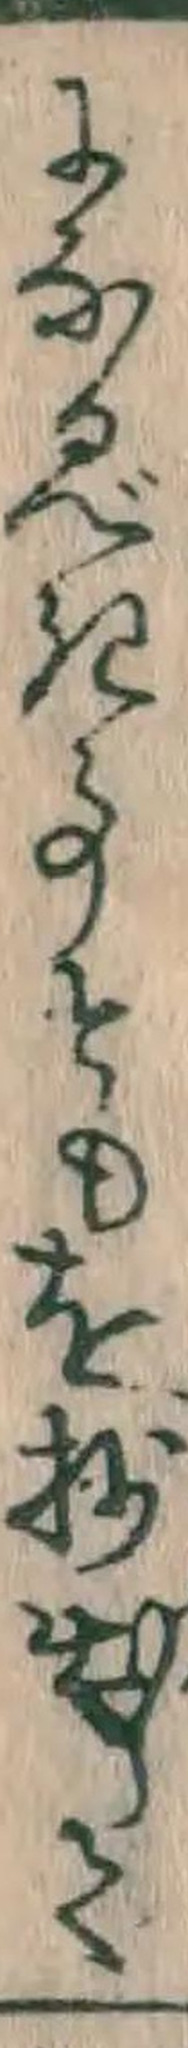になるべき事ともを抄出して
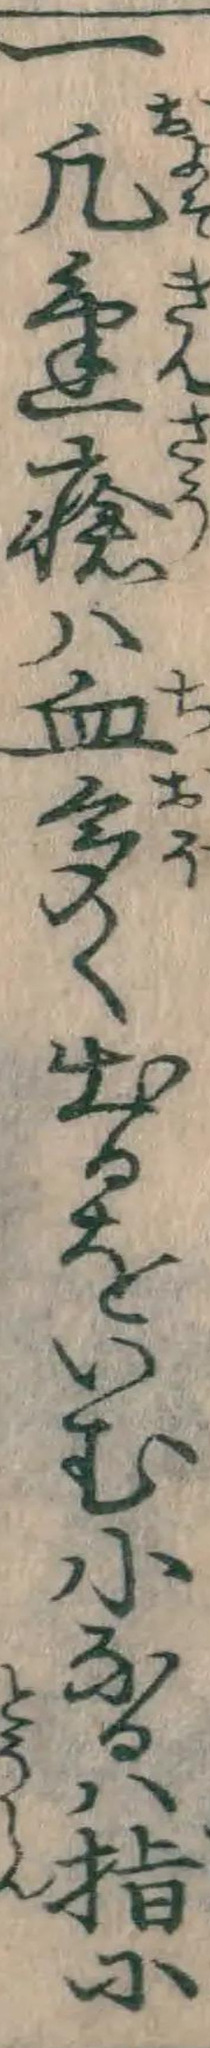一凡金瘡は血多く出るをいむ小なるは指に
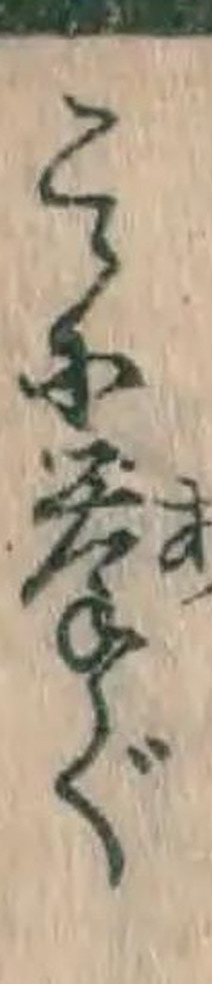こゝに挙ぐ
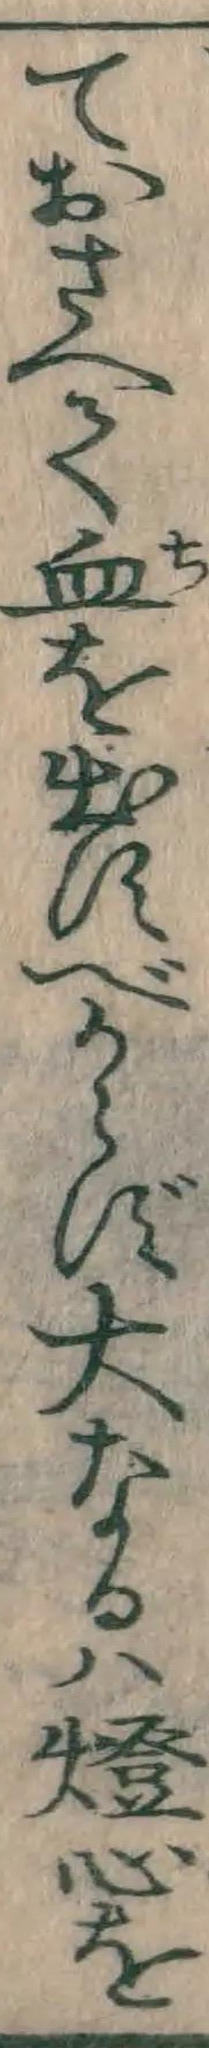ておさへて血を出すべからず大なるは燈心を

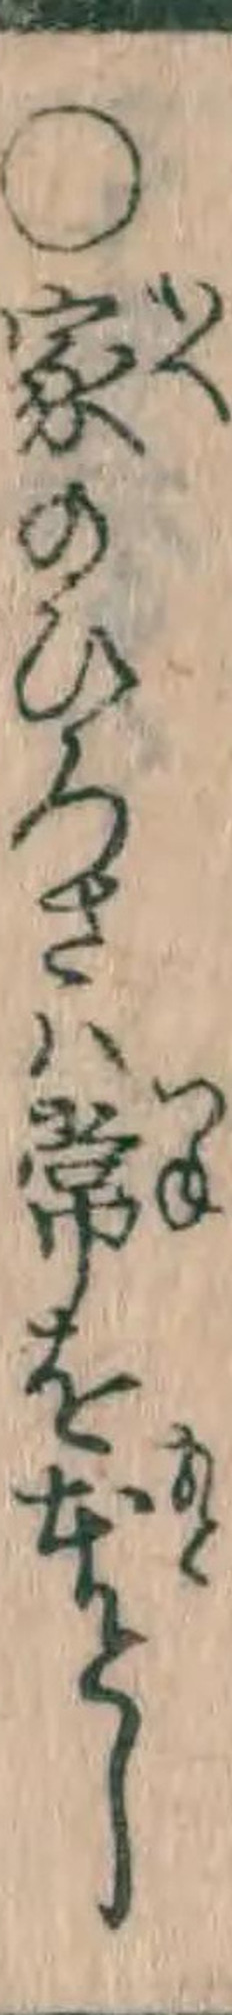○家のひろさは常を本とし
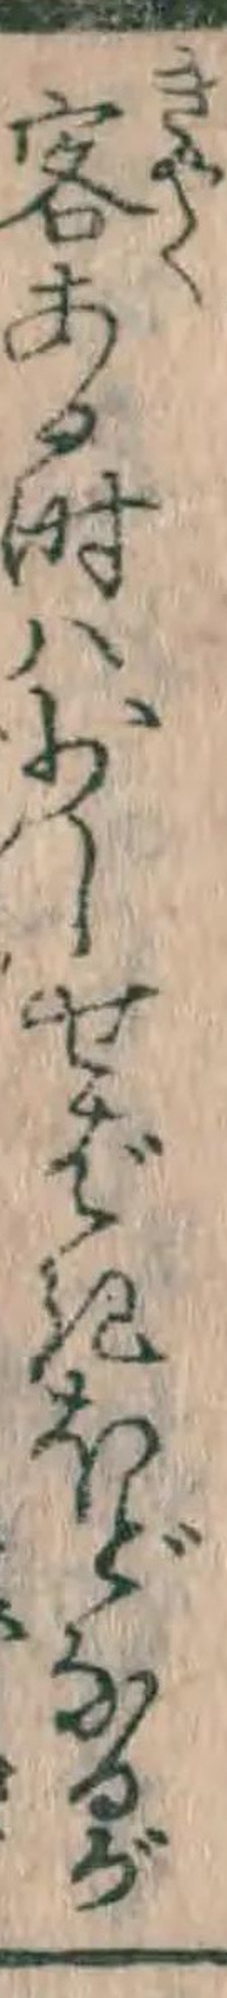客ある時は少しせばきほどなるが
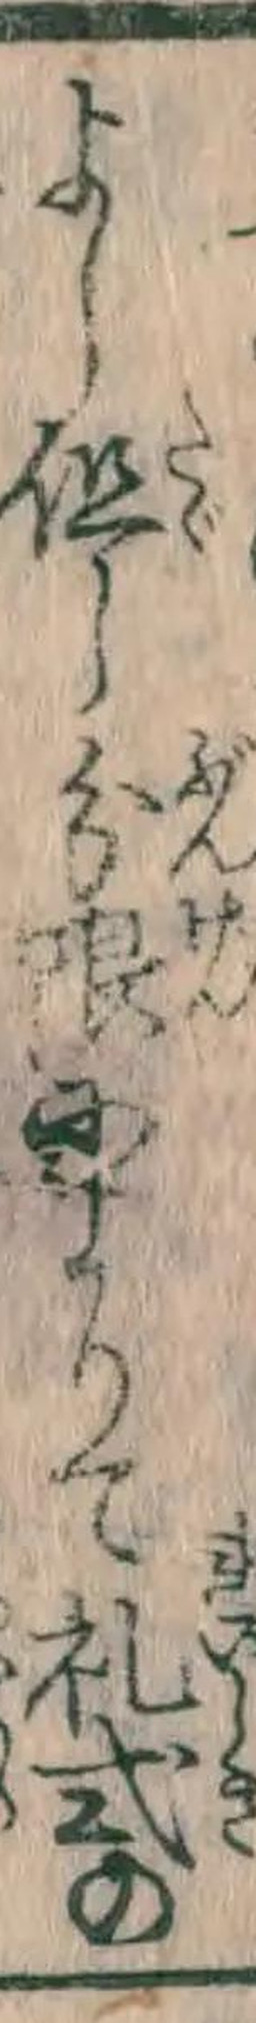よし但し分限によりて礼式の
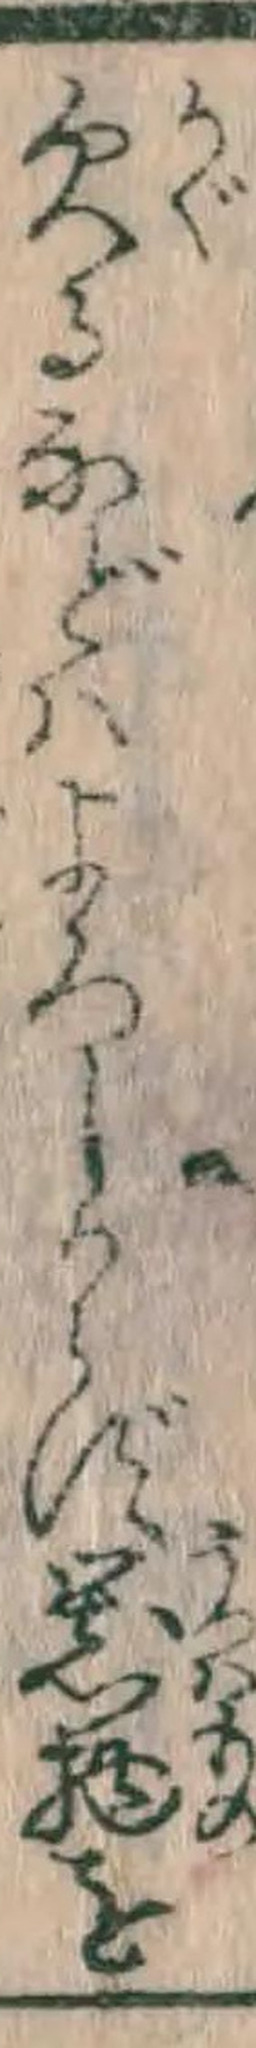欠るなどはよろしからず器物を
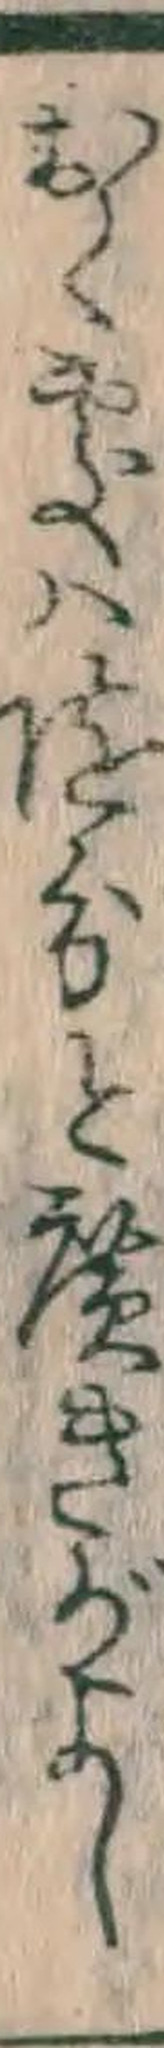おく處は随分と広きがよし
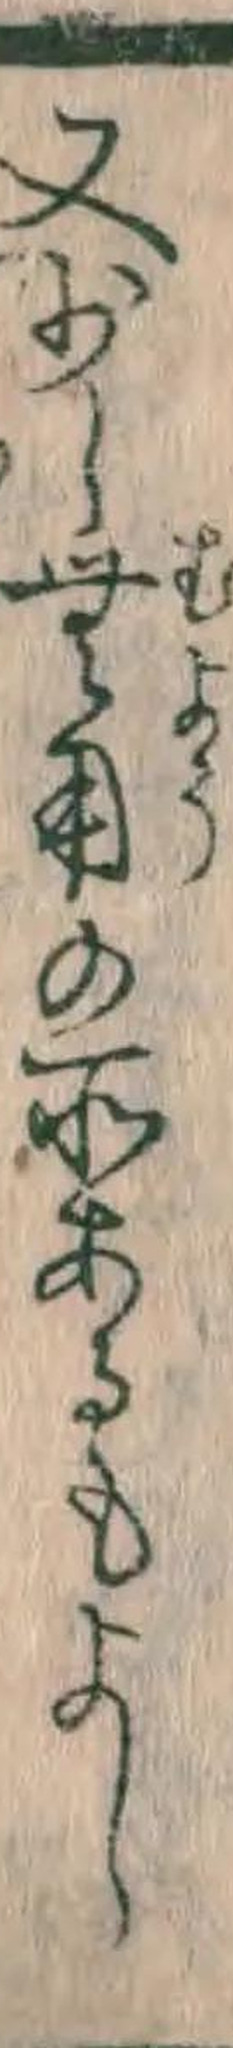又少し無用の所あるもよし
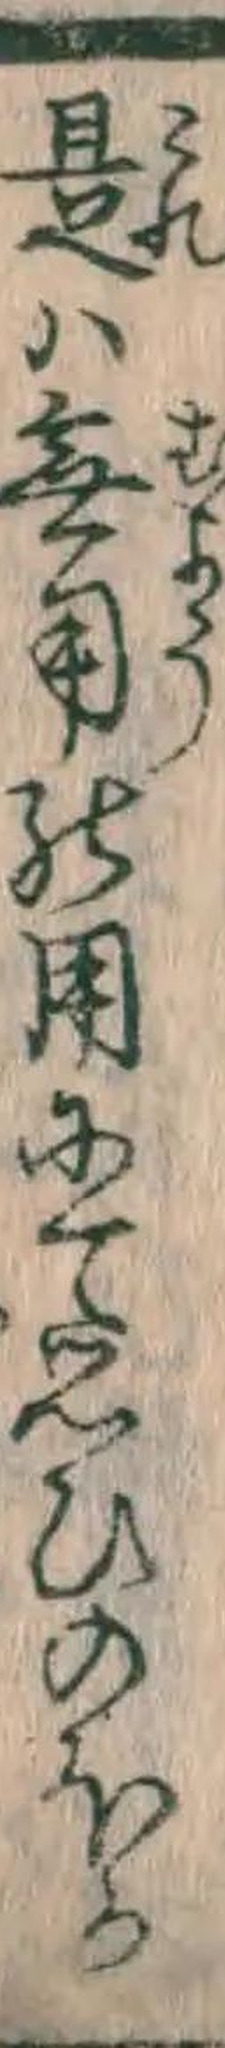是は無用の用にて思ひのほか
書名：広益秘事大全 3巻. [3]
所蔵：国立国会図書館 National Diet Library, JAPAN
